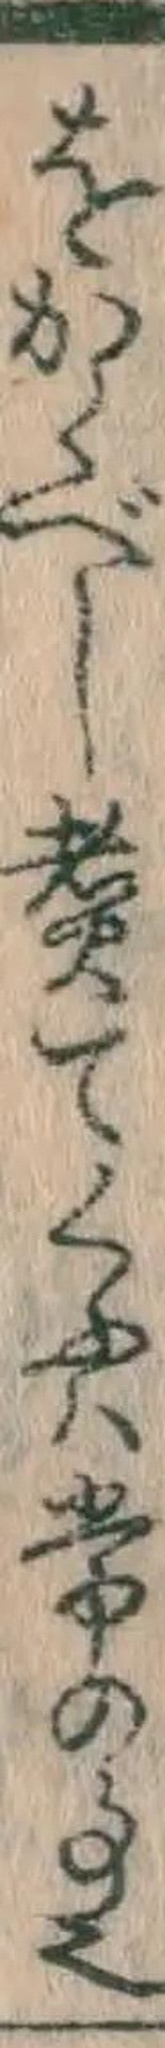をかくべし煮てくふは常の事也
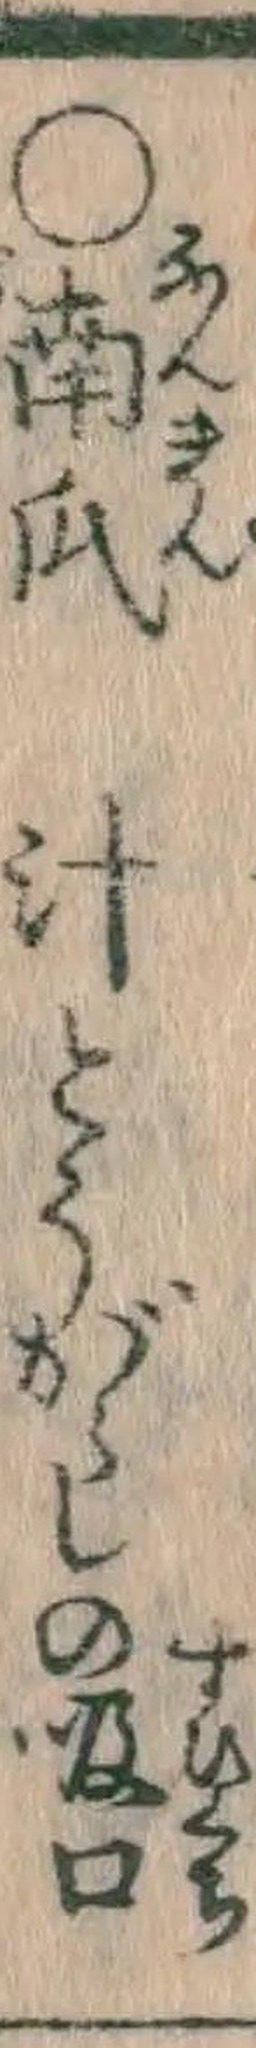○南瓜汁とうがらしの吸口
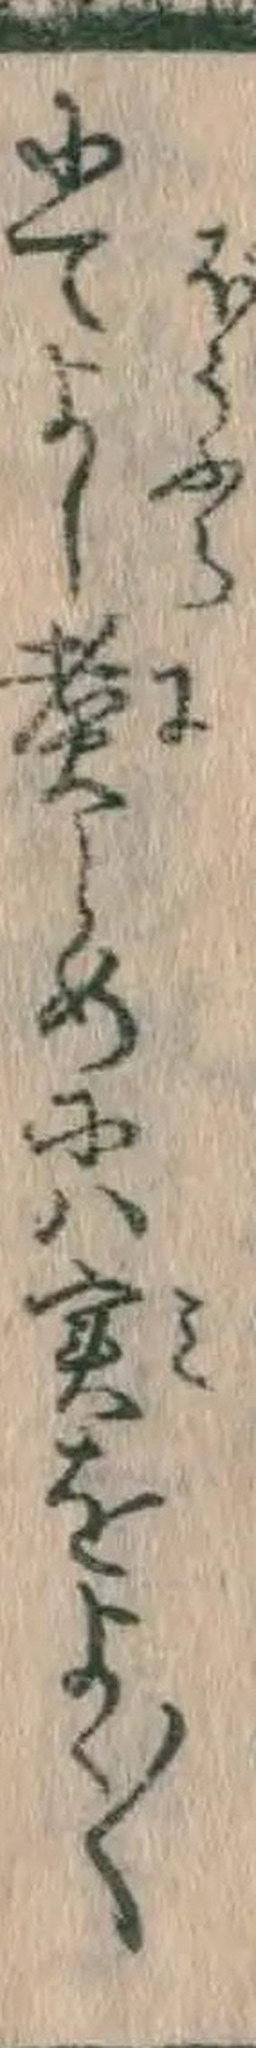にてよし煮しめには実をよく〳〵
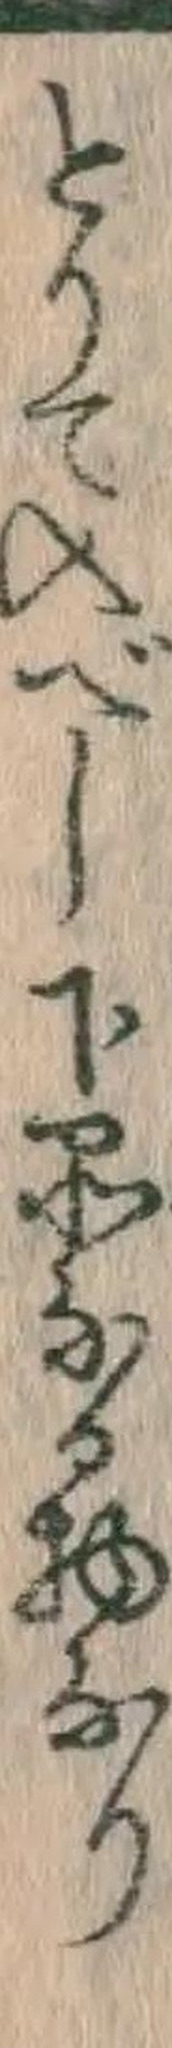とりて入べし下品なる物なり
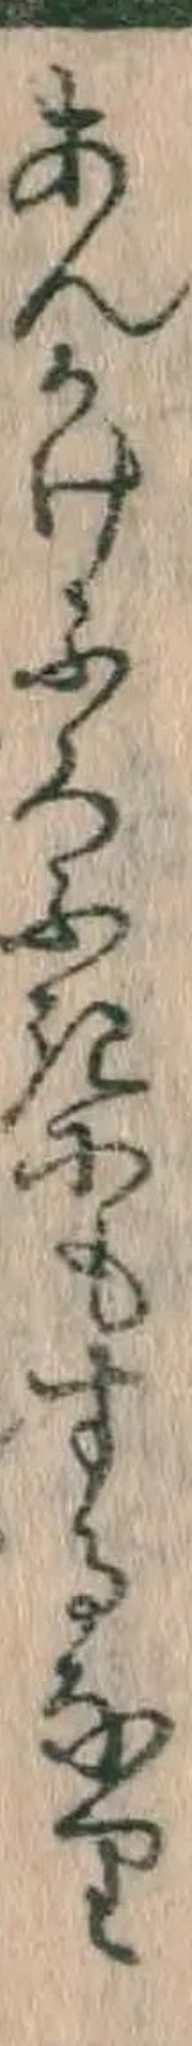あんかけふろふきにもするなり
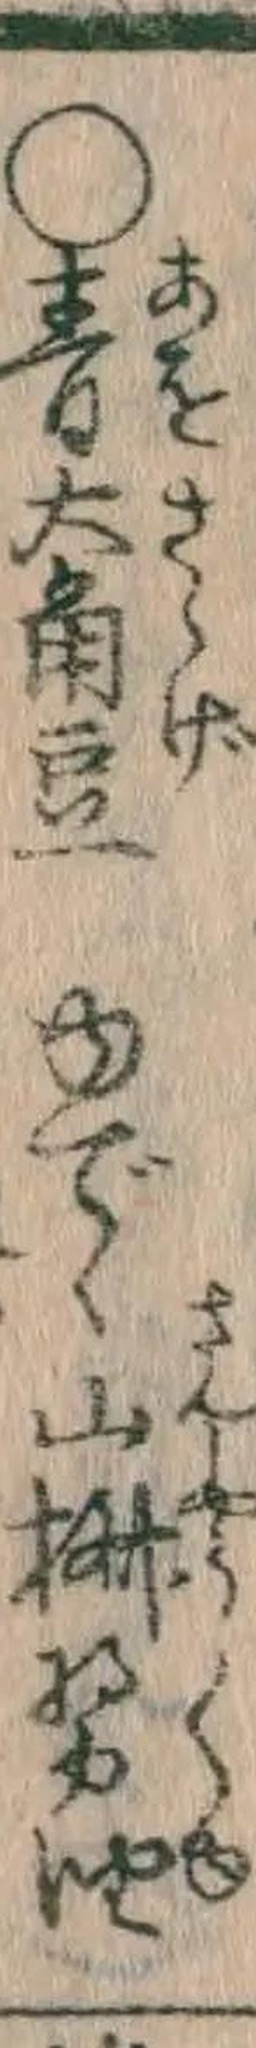○青大角豆ゆでゝ山椒醬油
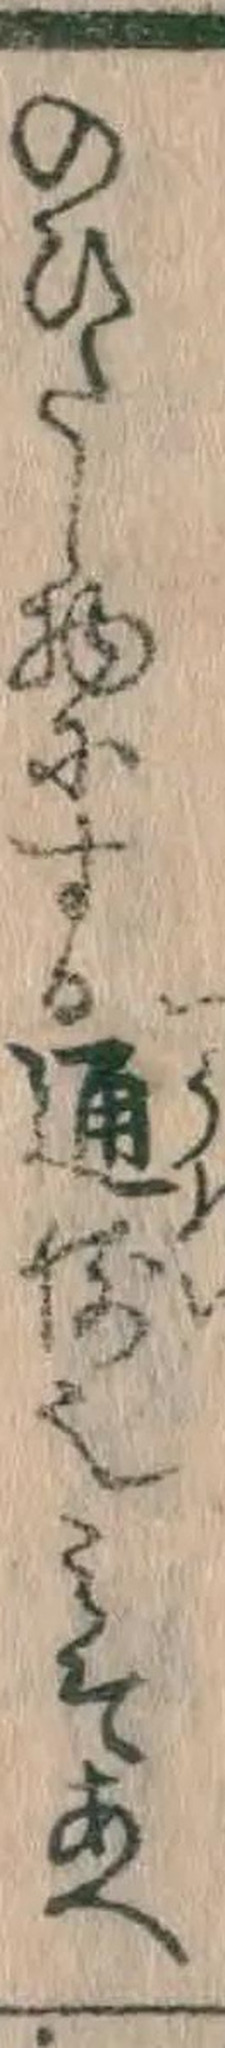のひたし物にする通例也みそあへ
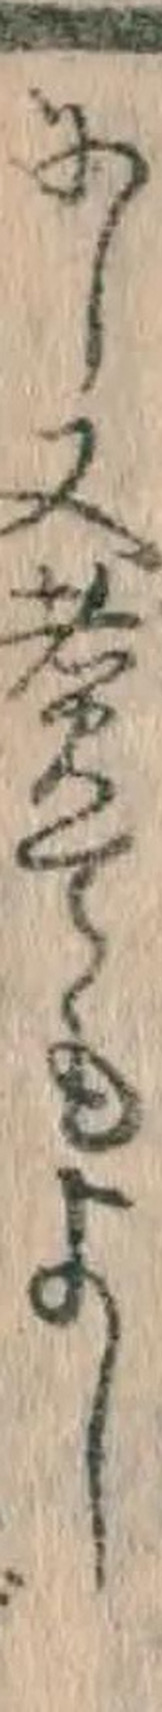にし又煮てもよし
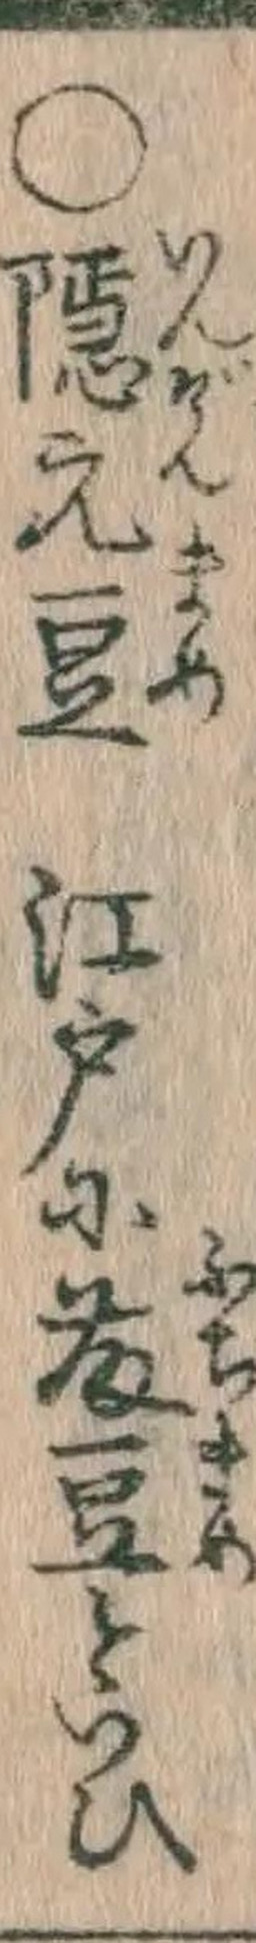○隠元豆江戸に藤豆といひ
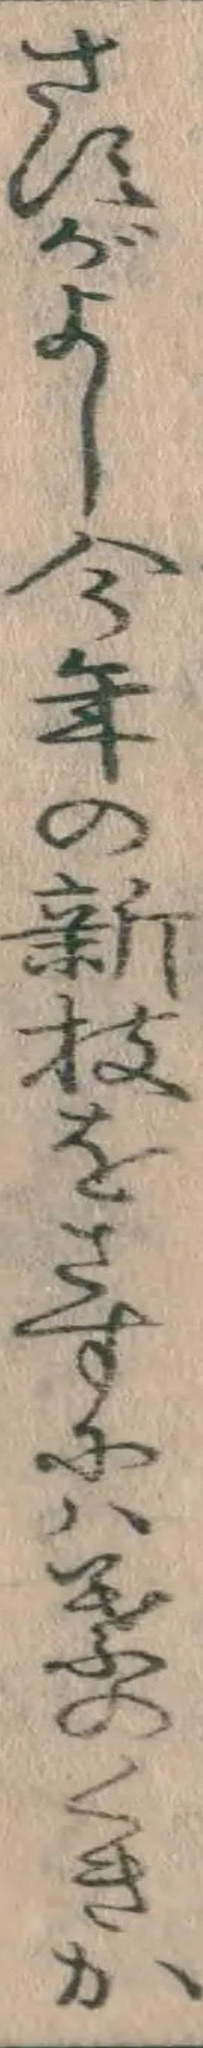さすがよし今年の新枝をさすには葉のくきか
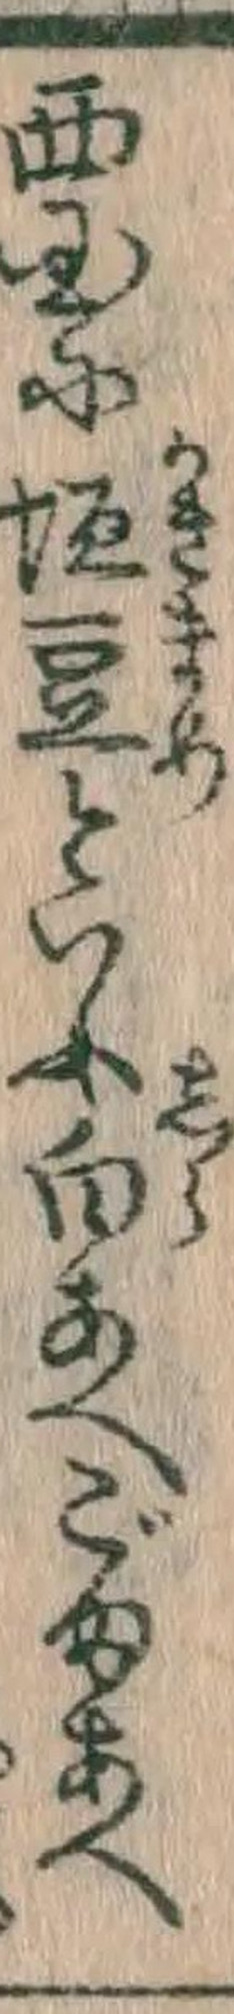西国に垣豆といふ白あへごまあへ
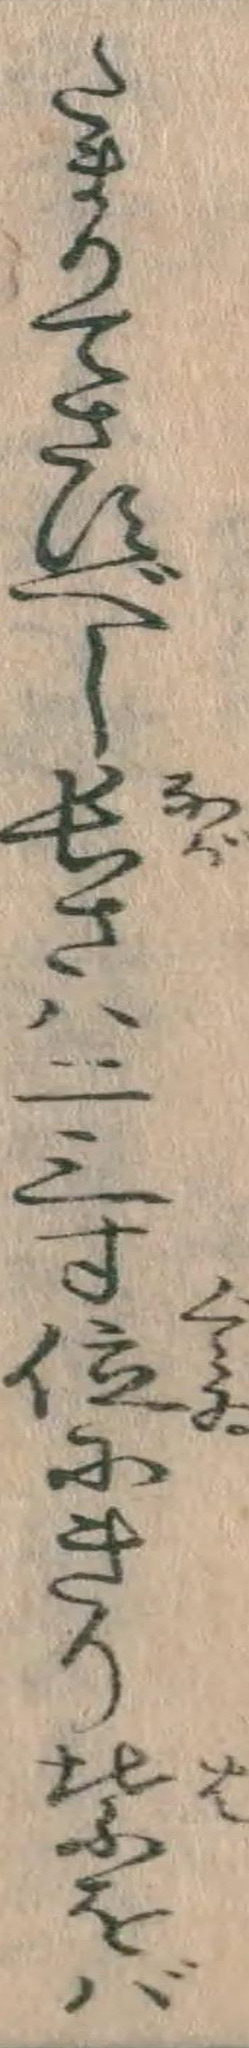たまりてさすべし長さは二三寸位にきり葉をば
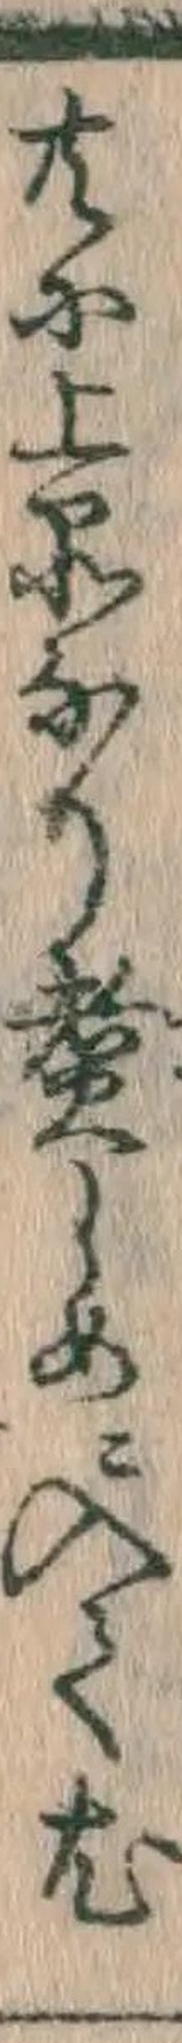共に上品なり煮しめに入て尤
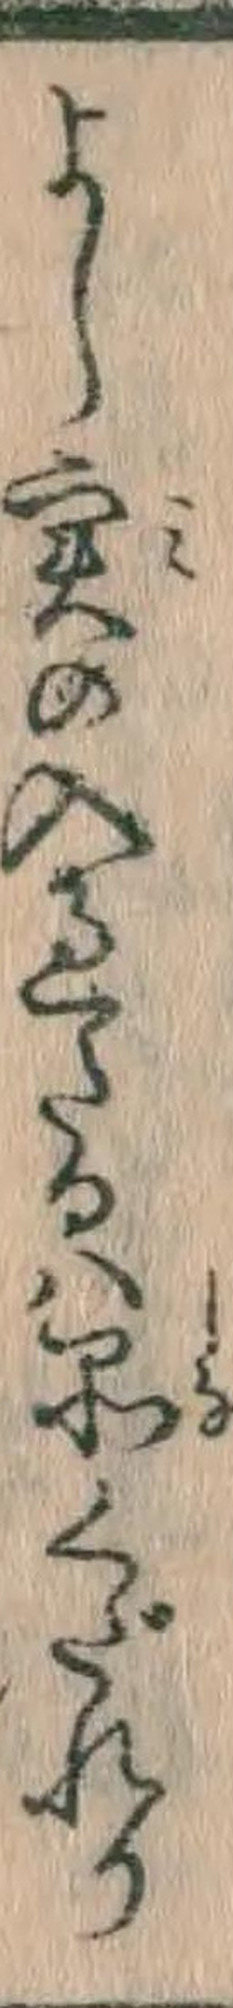よし実の入過たるは品くだれり
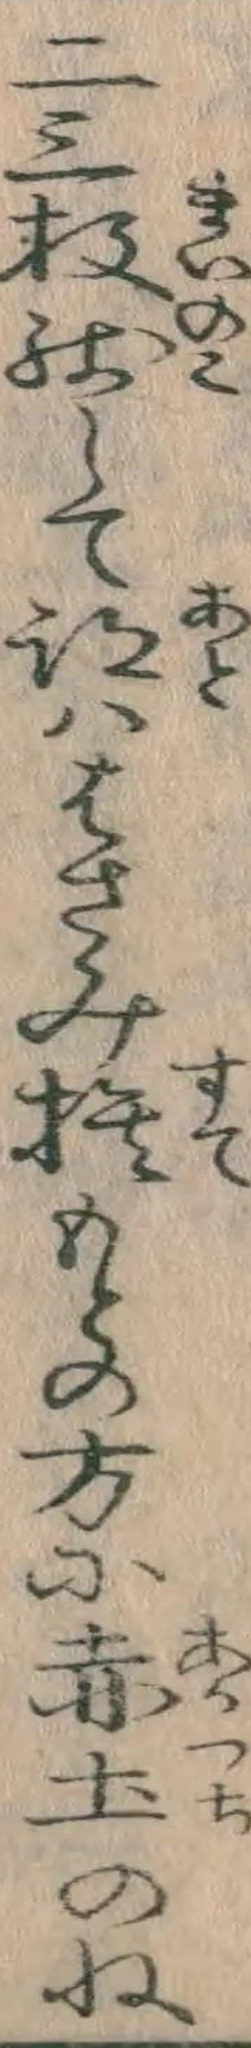二三枚残して跡ははさみ捨もとの方に赤土のね
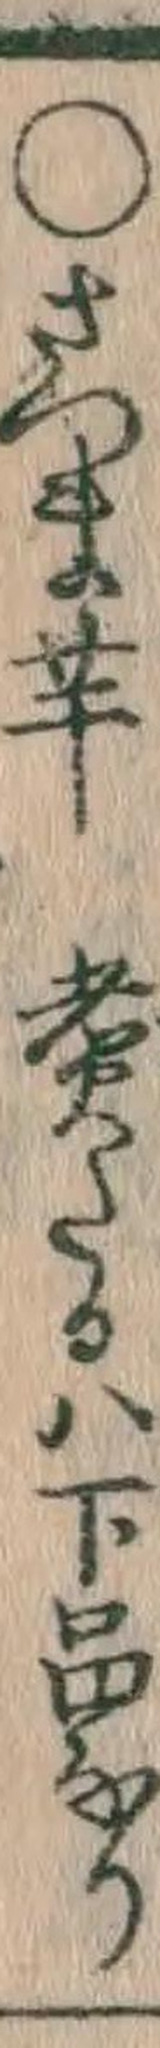○さつま芋煮たるは下品なり
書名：広益秘事大全 3巻. [5]
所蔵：国立国会図書館 National Diet Library, JAPAN
